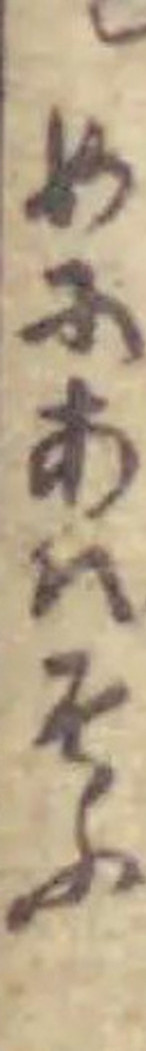めにあいそふ
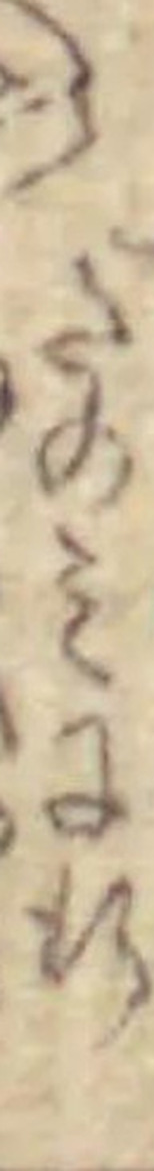たのみに行
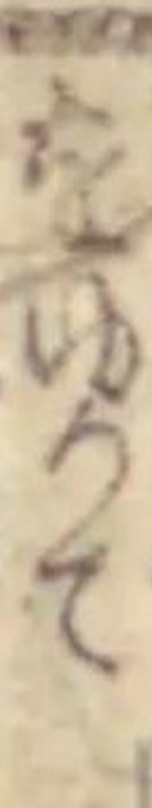をゆつて
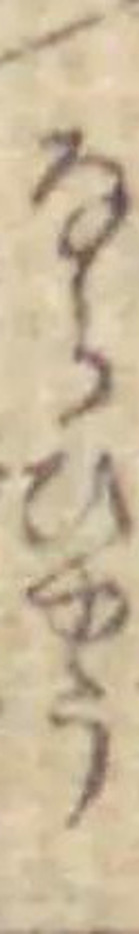ならひやう
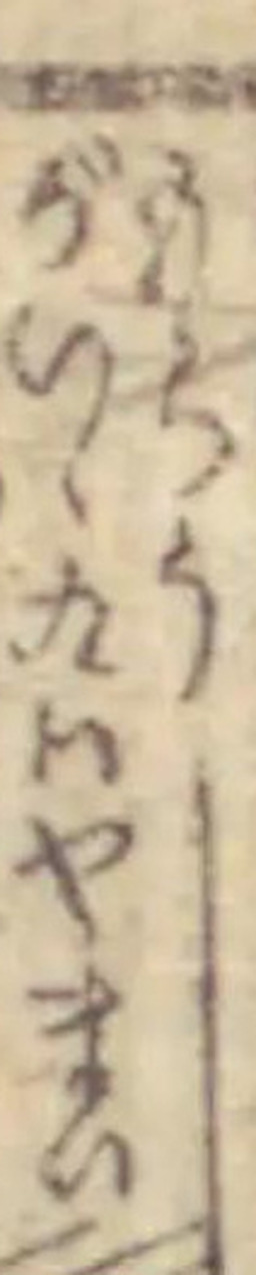がいゝ九はやまい
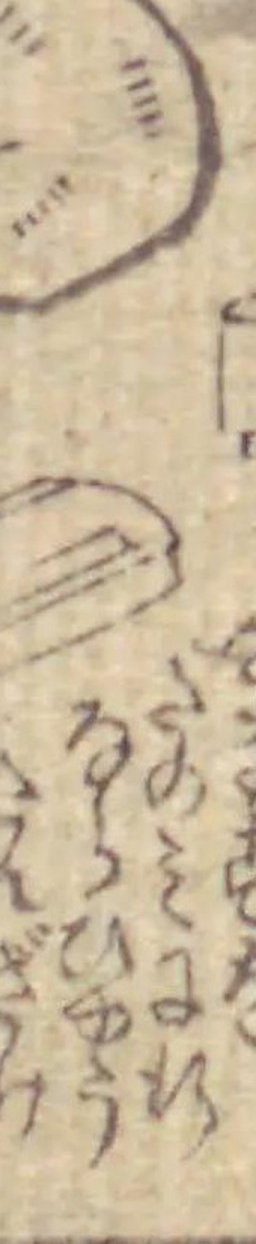ならひやう
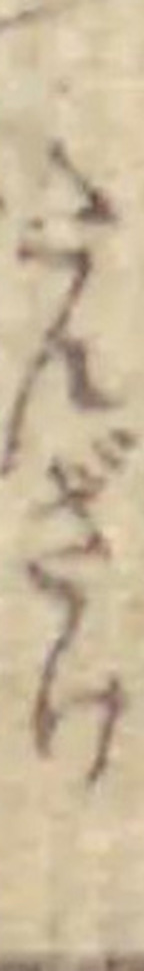たんざけ
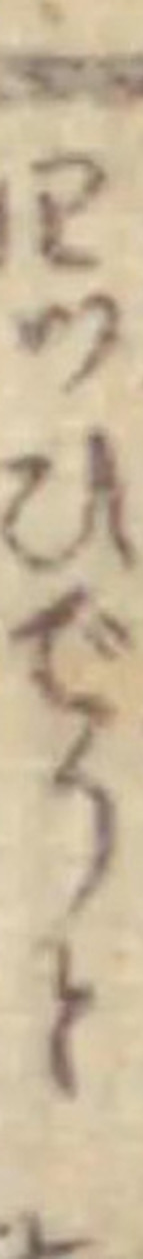四つひでりと
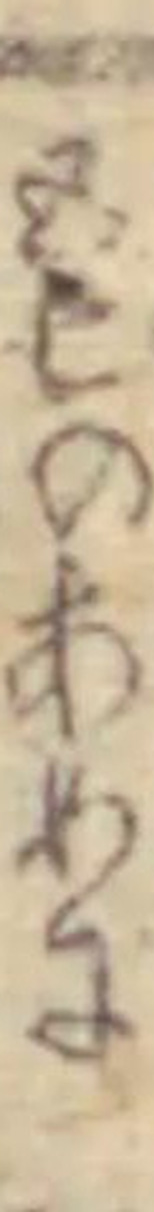五七のあめに
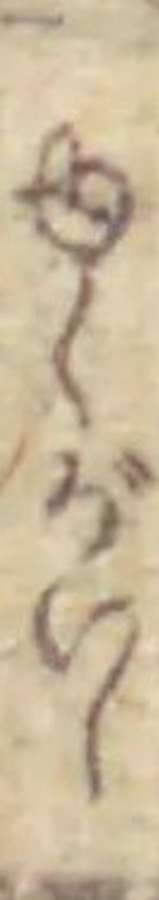ゆくがいゝ
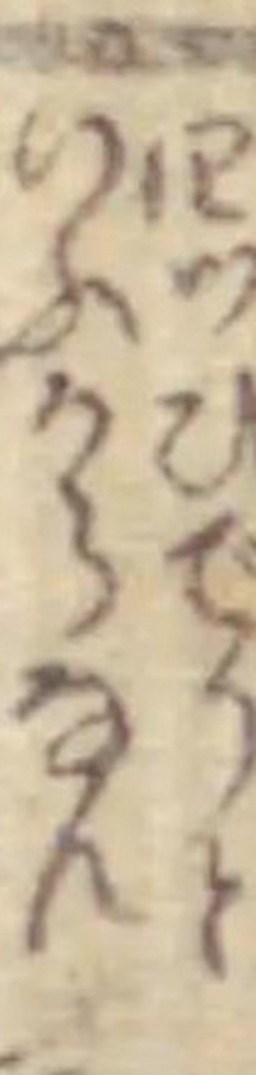いふからなん
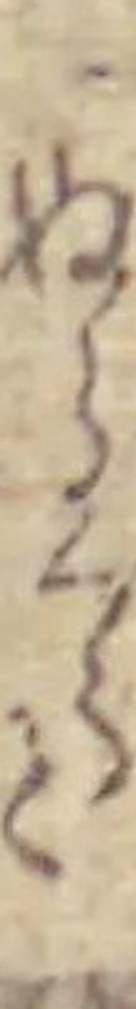ぬらくらと
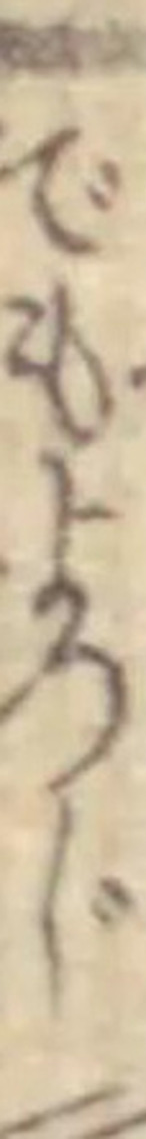でもよつじ
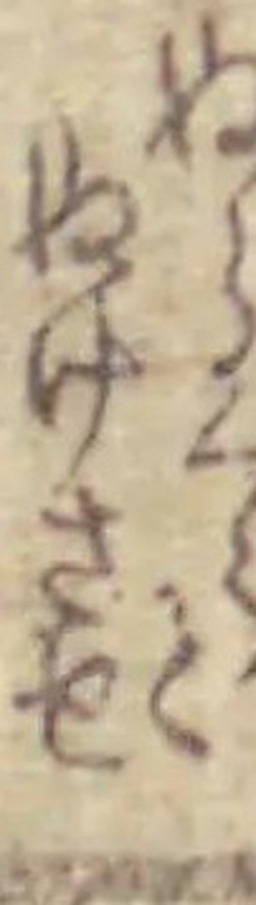ぬけさせ
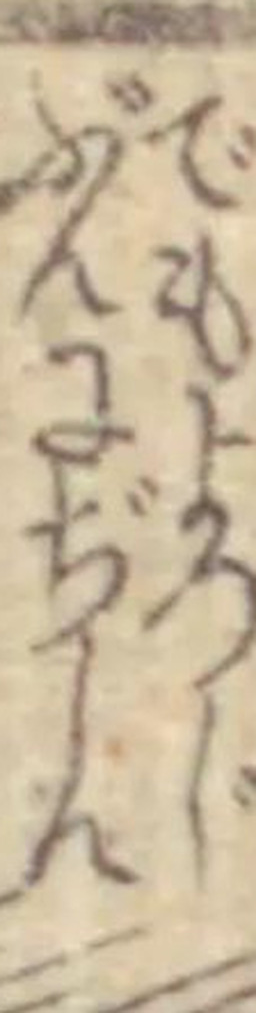ぶんにぢしん
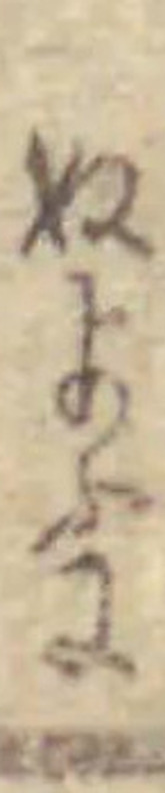ぬよふに
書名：雨宮風宮出儘略縁記 3巻
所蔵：国立国会図書館 National Diet Library, JAPAN
